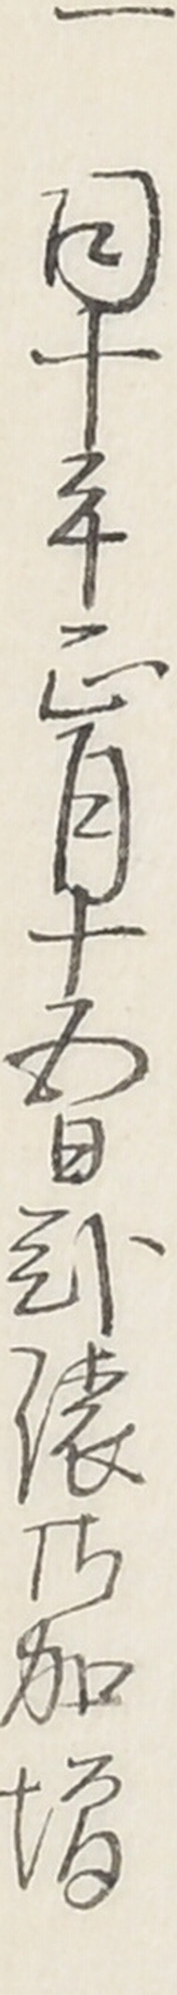一同十午正月十五日弐俵御加増
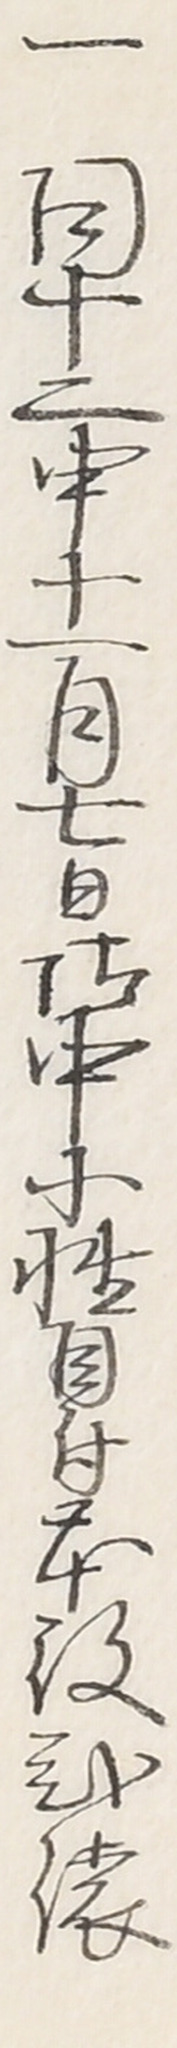一同十二申十一月七日御中小性目付本役弐俵
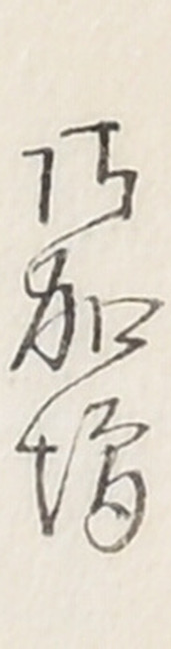御加増
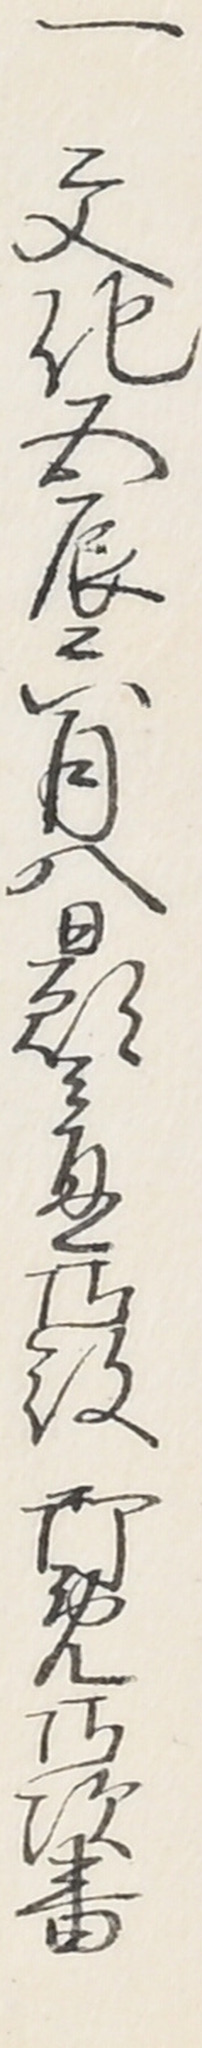一文化五辰六月八日願之通御役御免御次番
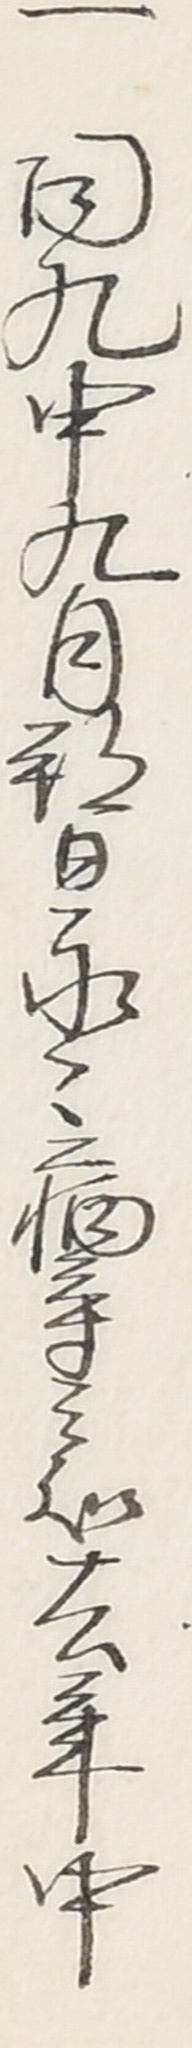一同九申九月朔日永々病気之処去年中
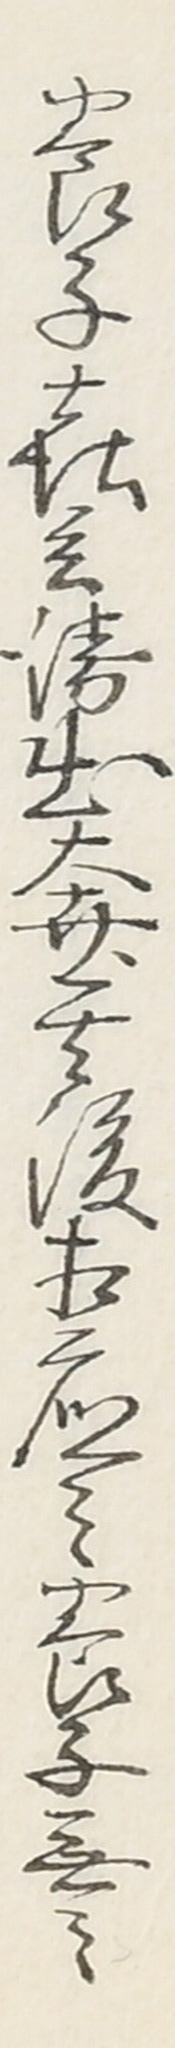養子喜兵衛出奔其後相応之養子無之
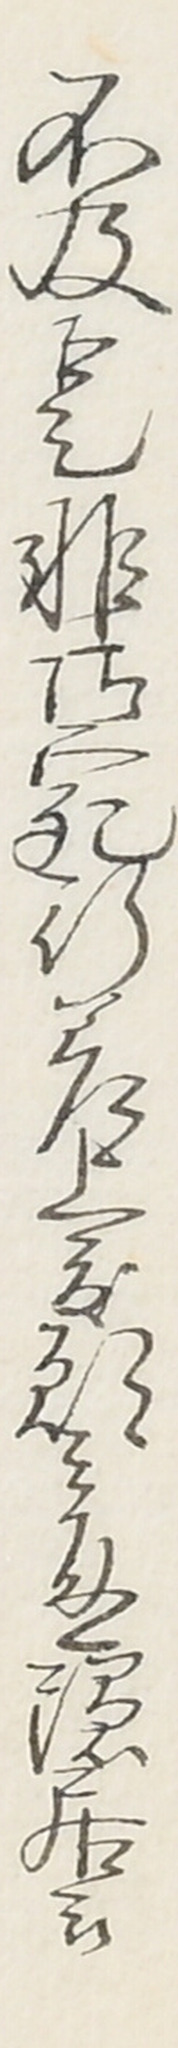不及是非御宛行差上度願之通隠居被
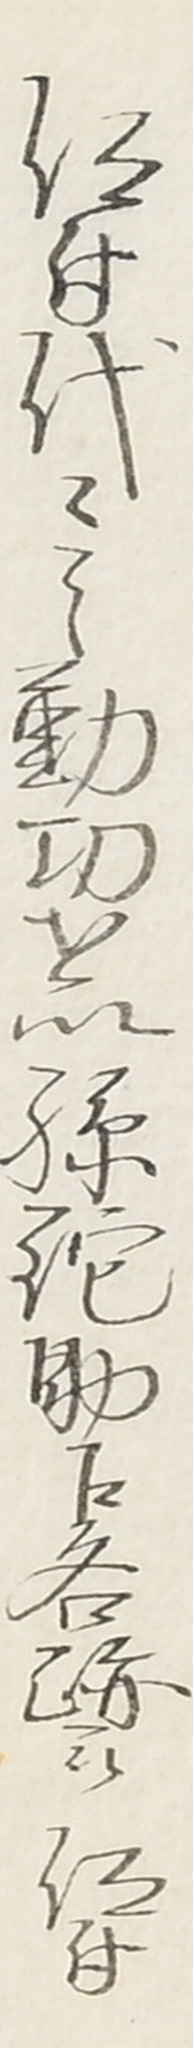仰付代々之勤功を以孫鉈助江名跡被仰付
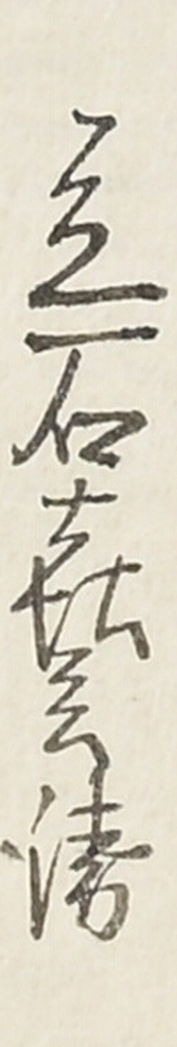立石喜兵衛
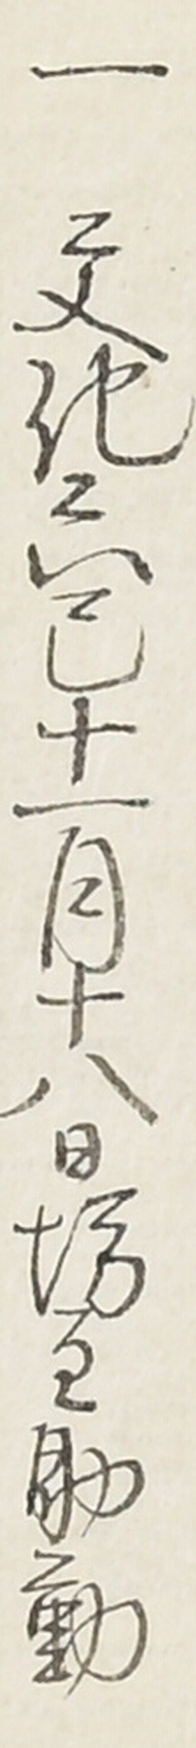一文化六巳十一月十八日坊主助勤
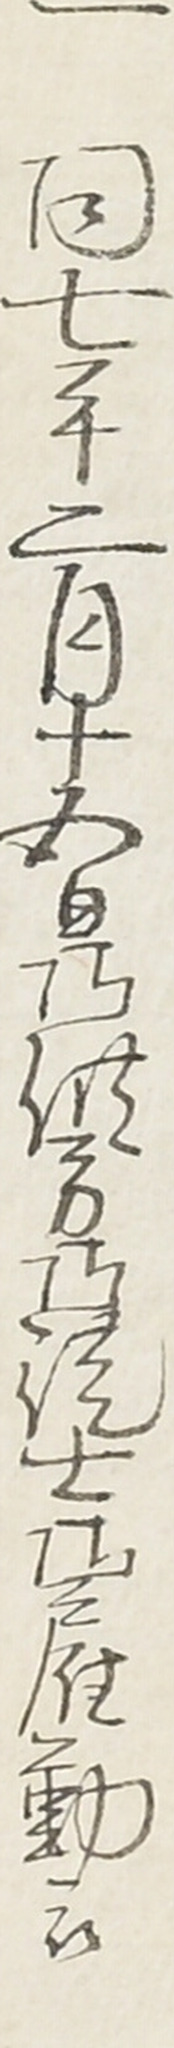一同七午二月十五日御供方御徒士御雇勤被
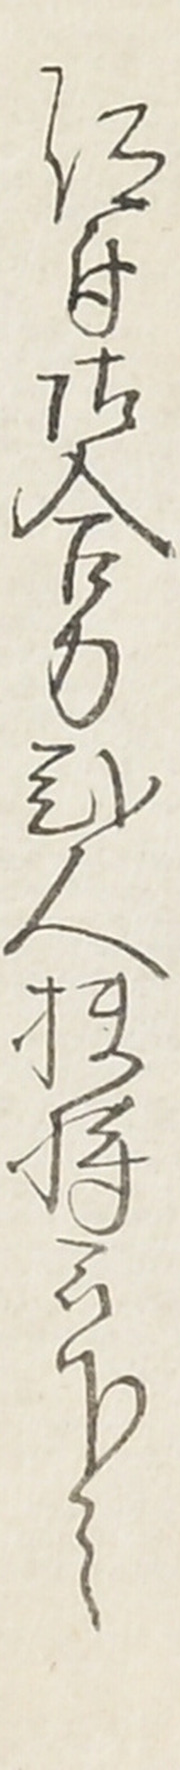仰付御合力弐人扶持被下之
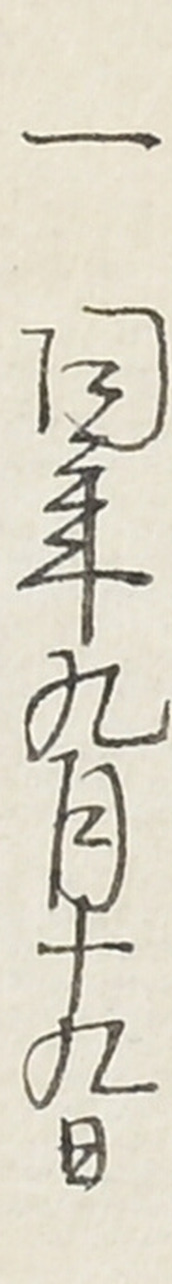一同年九月十九日
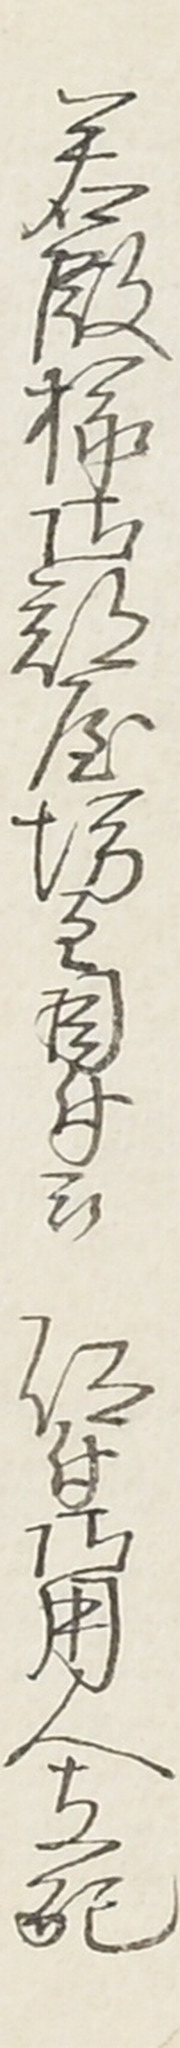若殿様御部屋坊主目付被仰付御用人支配
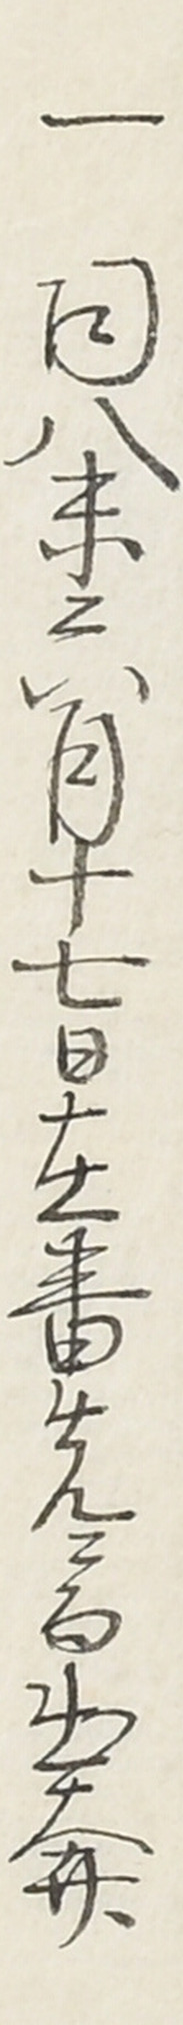一同八未六月十七日在番先ニ而出奔

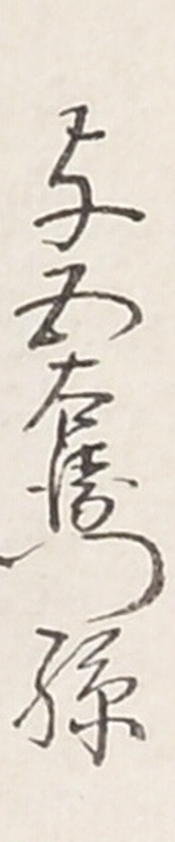与五右衛門孫
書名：無足諸士勤仕録（四）
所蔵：伊那市立高遠町図書館・合同会社AMANE
